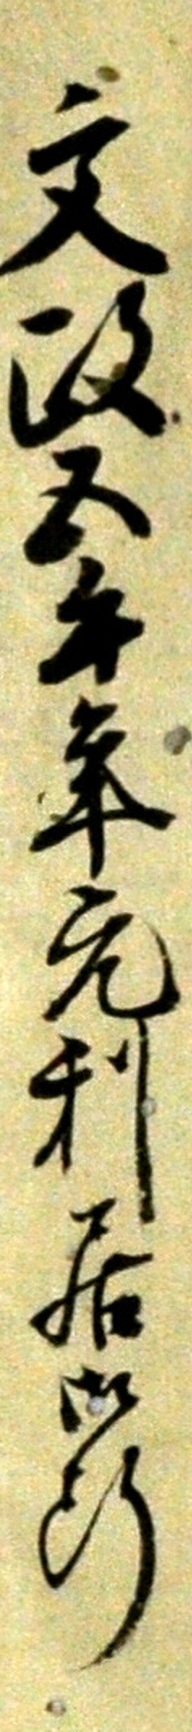文政五午年元利居御断
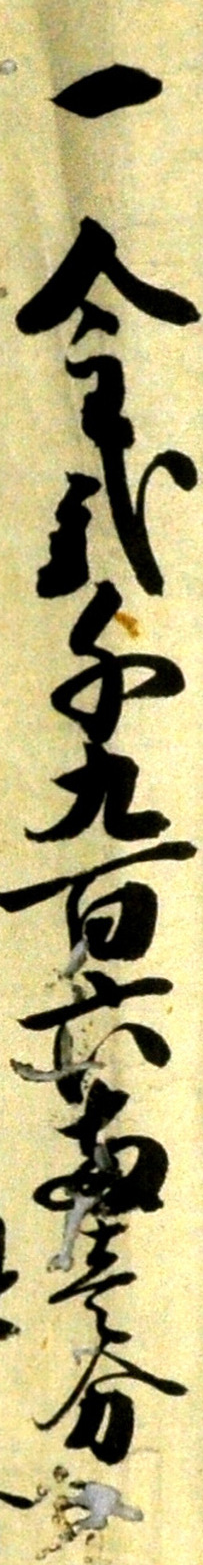一金弐千九百六両壱分
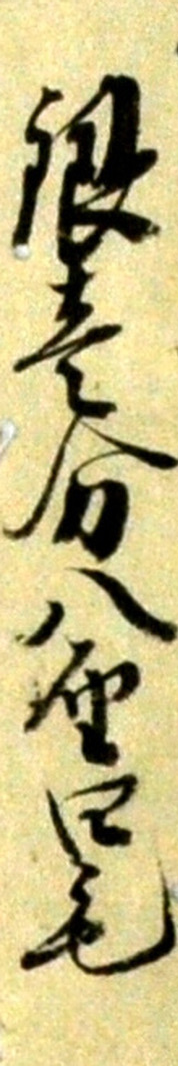銀壱分八厘四毛
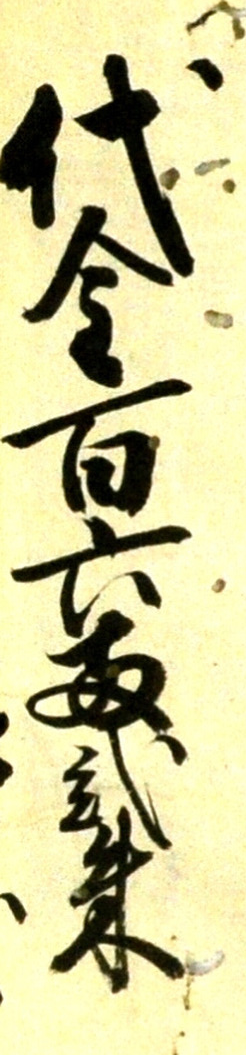代金百六両弐朱
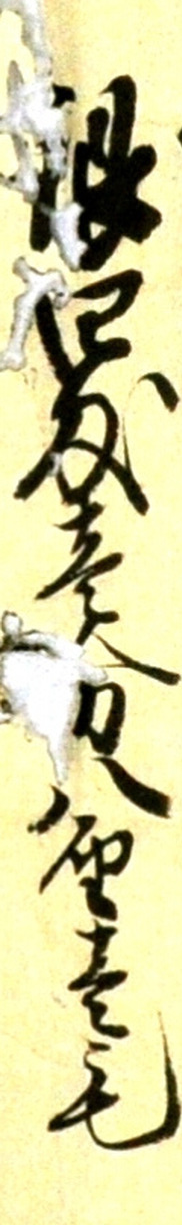銀四匁壱分八厘壱毛
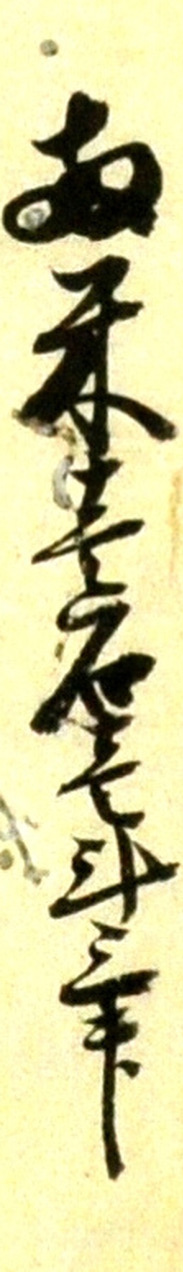両米壱石壱斗三升
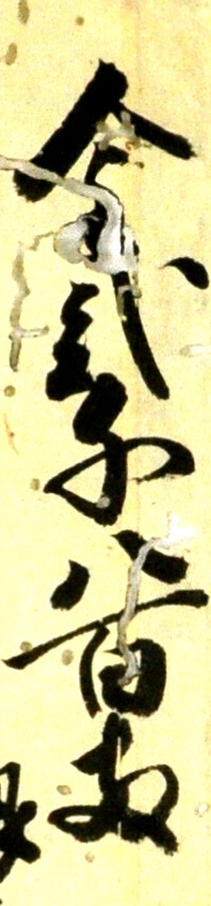金弐千八百両
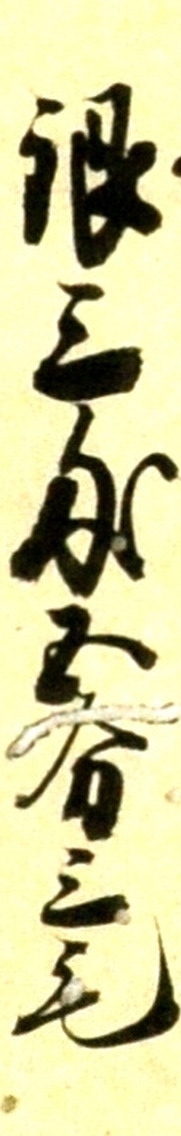銀三匁五分三毛
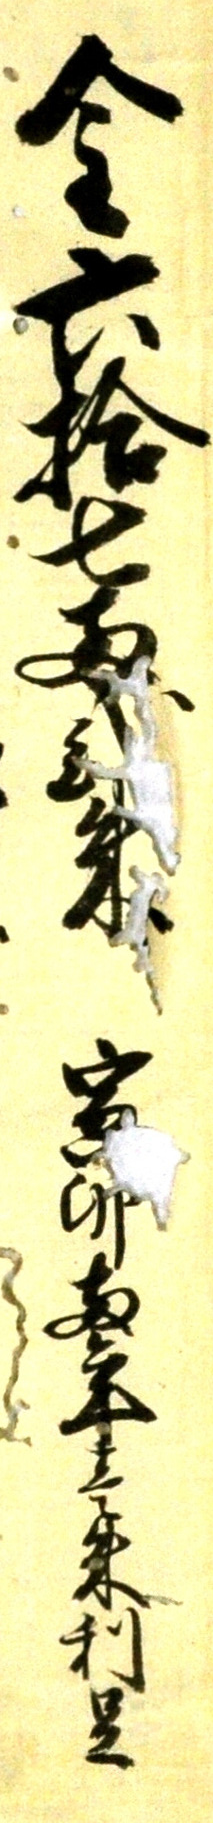金六拾七両弐朱寅卯両年壱朱利足
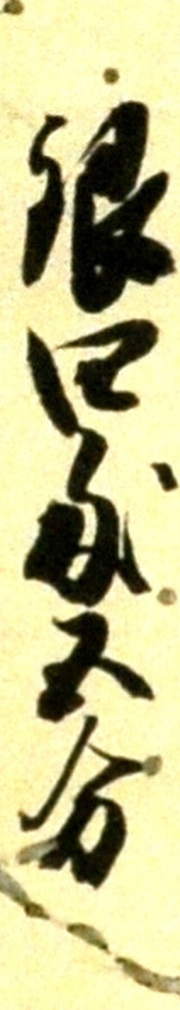銀四匁五分
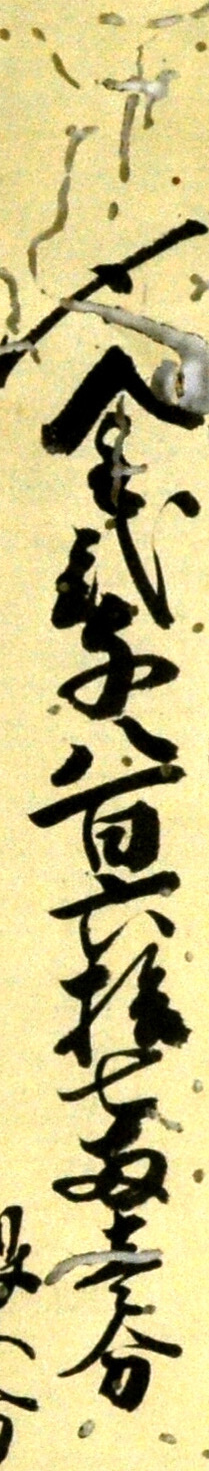〆金弐千八百六拾七両壱分
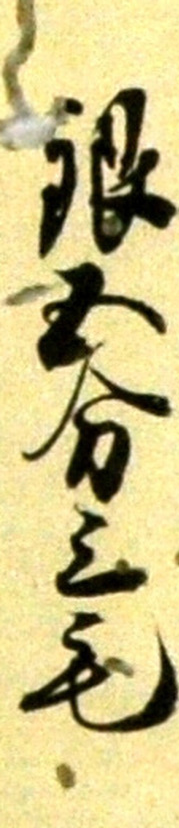銀五分三毛
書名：覚
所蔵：伊那市立高遠町図書館・合同会社AMANE
